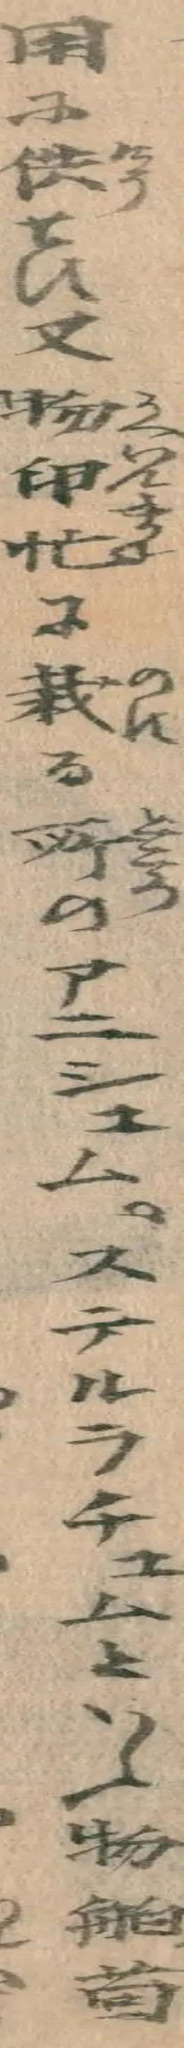用に供せす又物印忙に栽る所のアニシュム。ステルラチュムといふ物舶茴
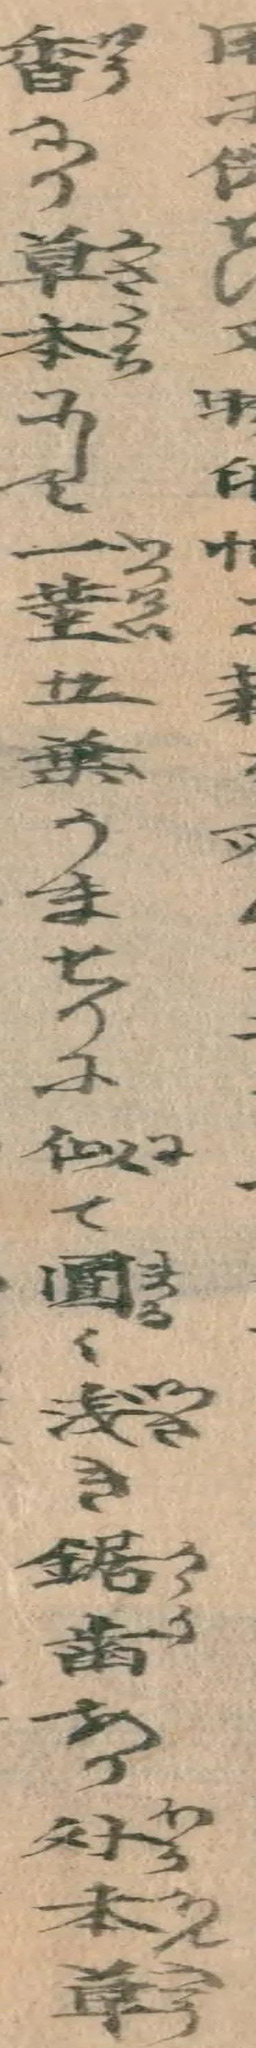香なり草本にして一茎五葉うませりに似て円く浅き鋸歯あり外本草
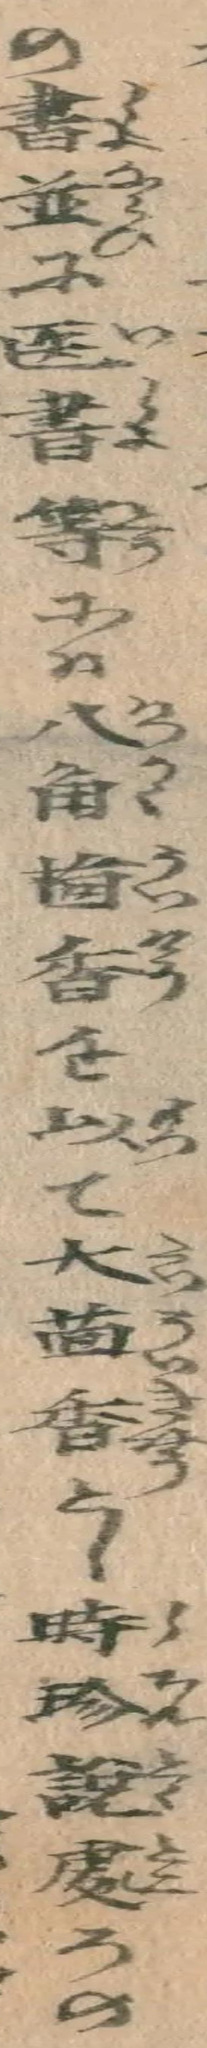の書並に医書等には八角茴香を以て大茴香とし時珍説処ろの
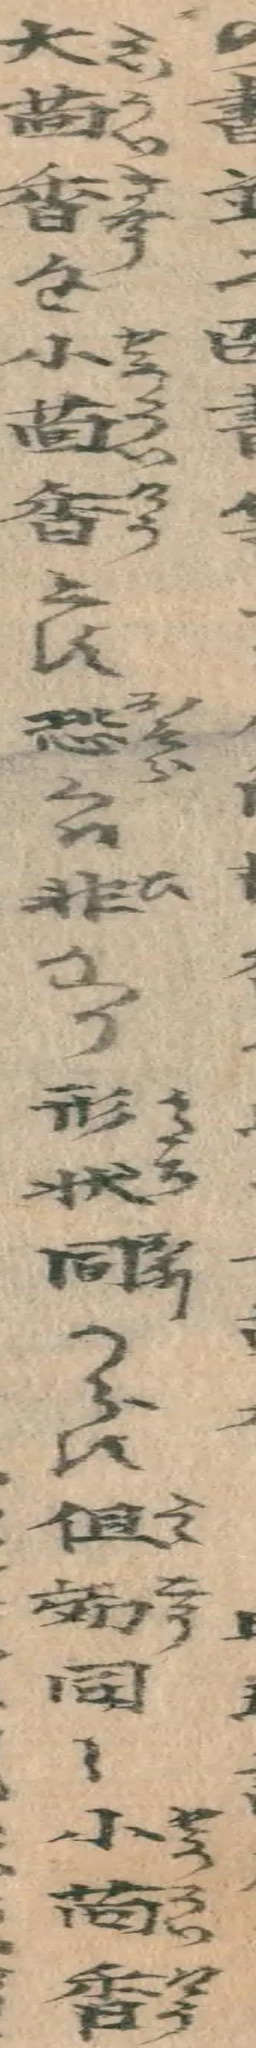大茴香を小茴香とす恐くは非なり形状同からす但効同し小茴香

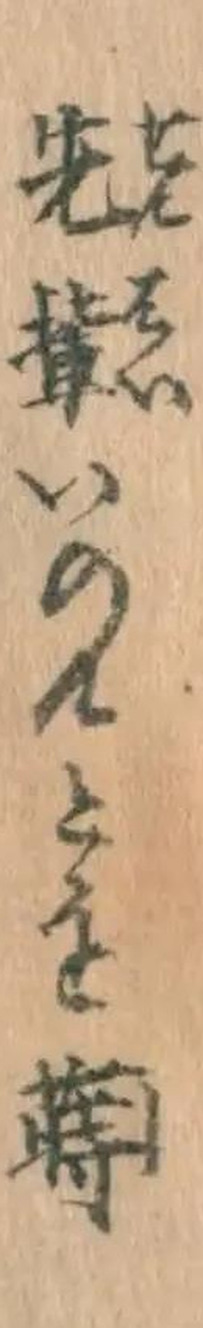先輩いのんとを蒔
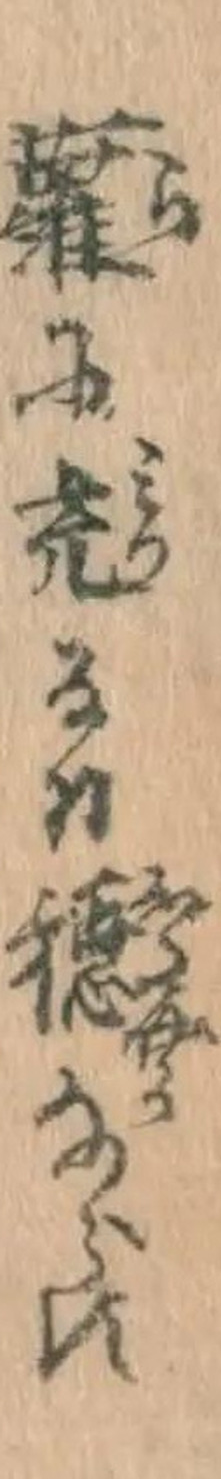蘿に充るは穏ならす
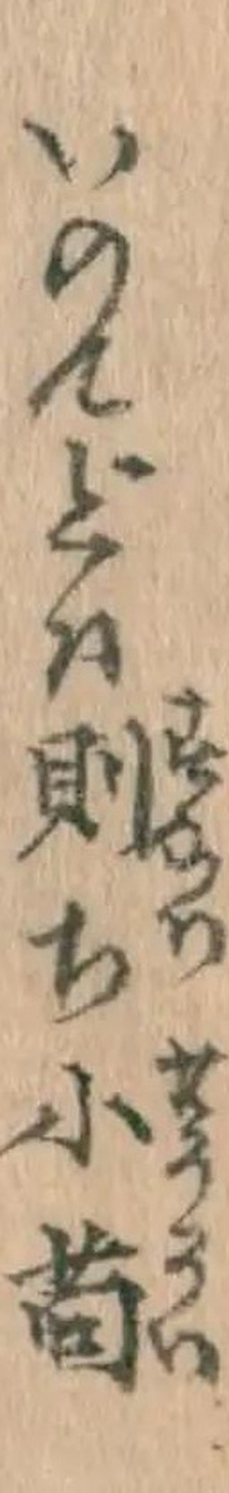いのんどは則ち小茴
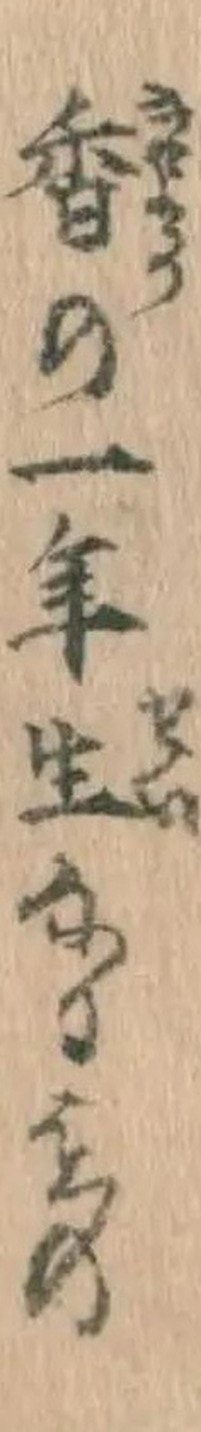香の一年生なるもの
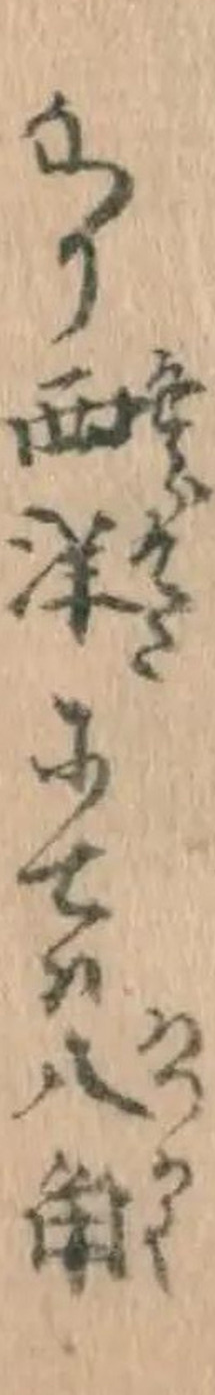なり西洋にては八角
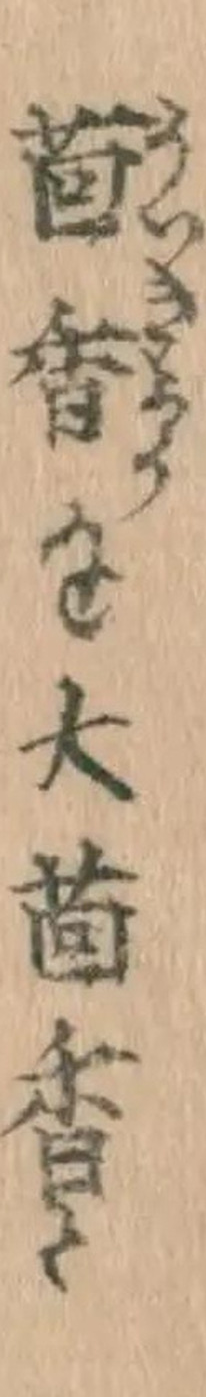茴香を大茴香と
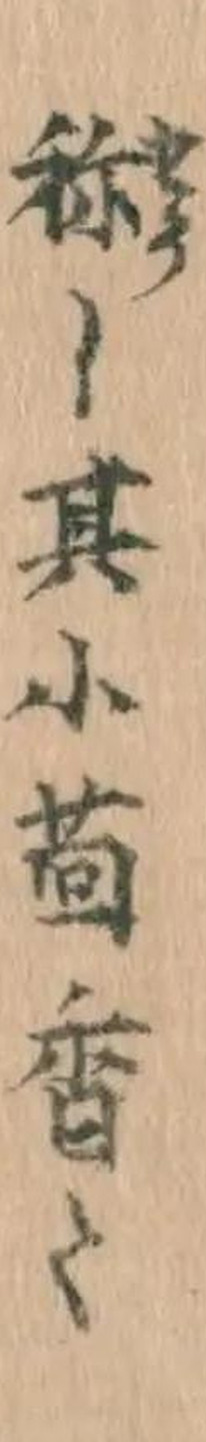称し其小茴香と
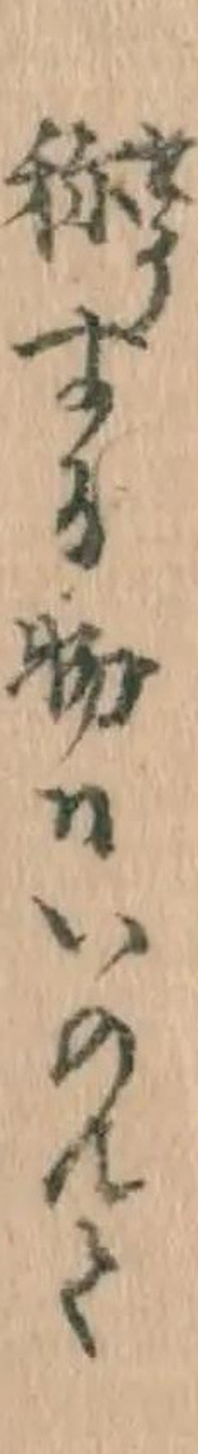称する物はいのんと
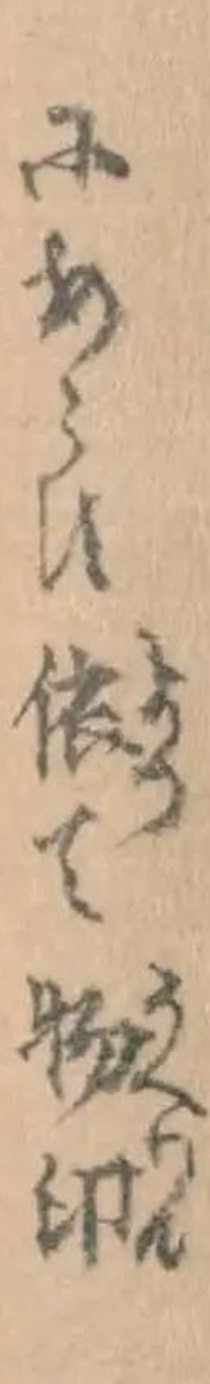にあらす依て物印
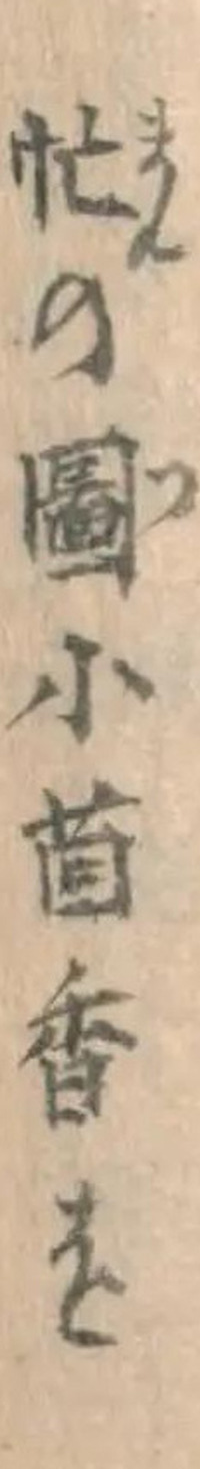忙の図小茴香を

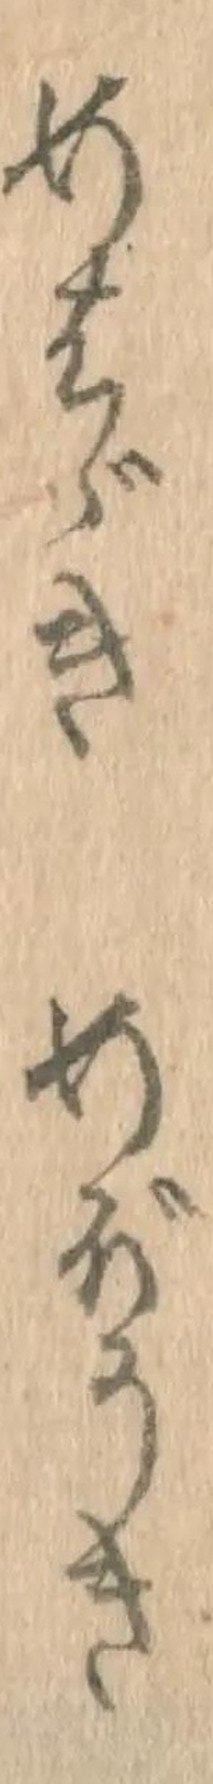めはゞきめぼうき
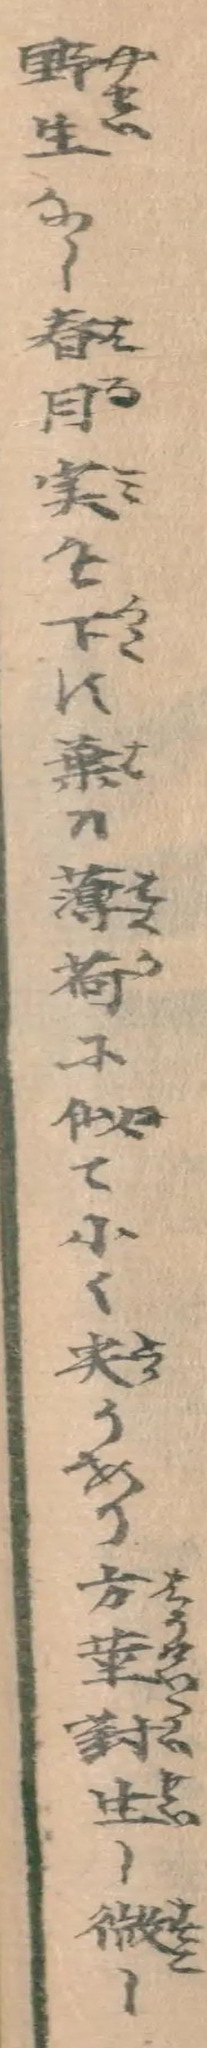野生なし春月実を下す葉は薄荷に似て小く尖りあり方茎対生し微し
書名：本草図譜. 巻46-48
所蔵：国立国会図書館 National Diet Library, JAPAN
